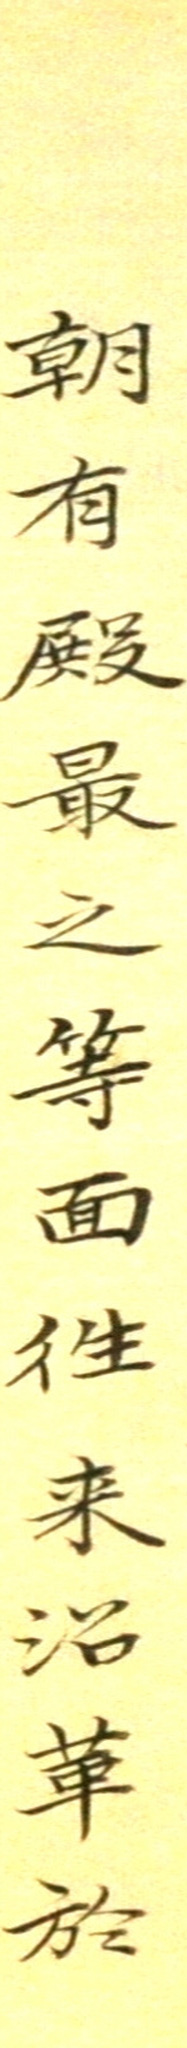朝有殿最之等面往来沿革於
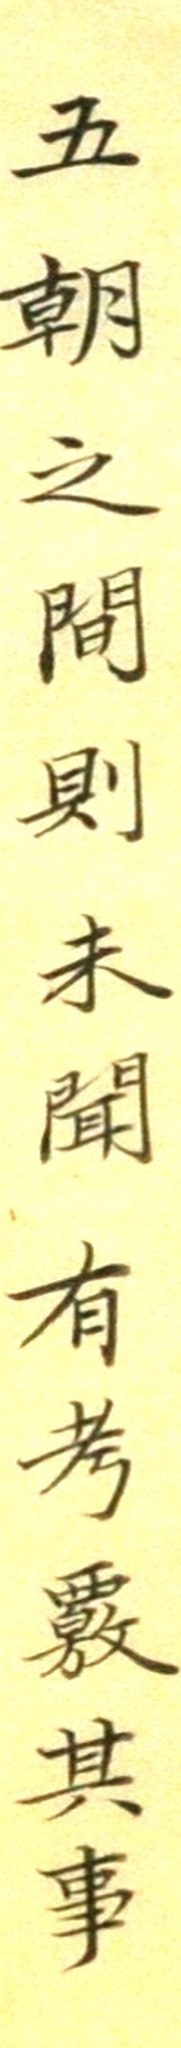五朝之間則未聞有考覈其事
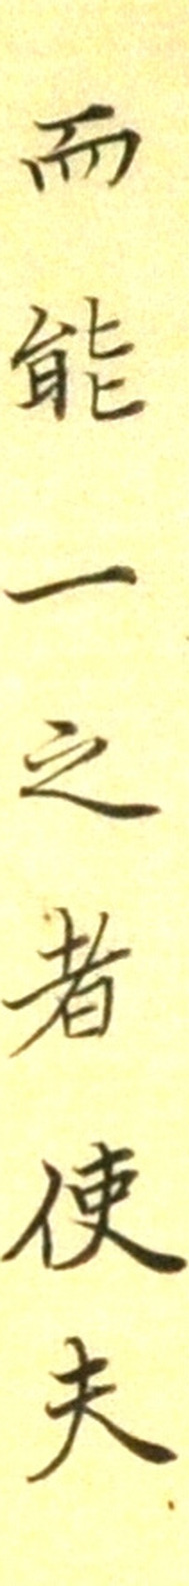而能一之者使夫
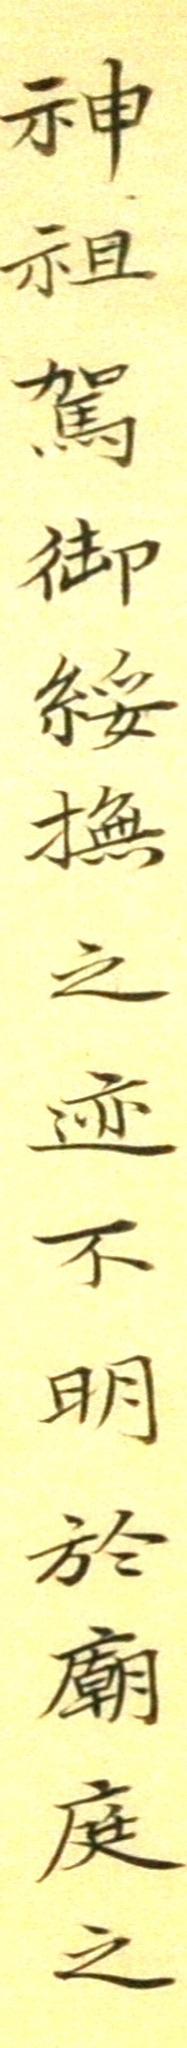神祖駕御綏撫之迹不明於廟庭之
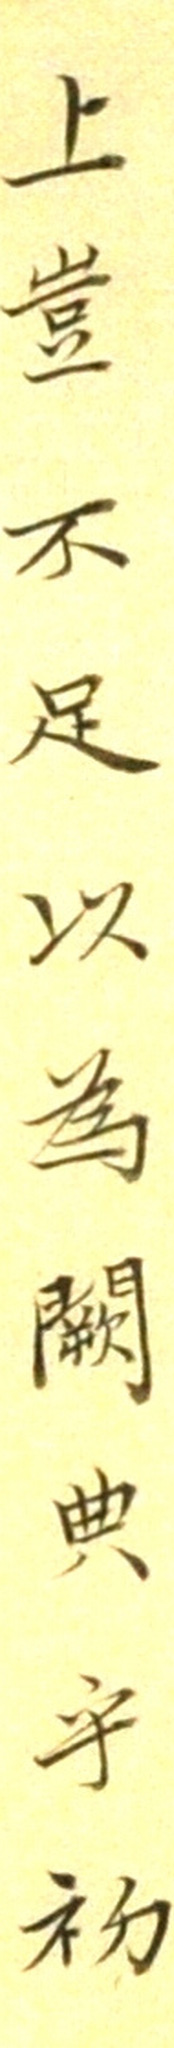上豈不足以為闕典乎初
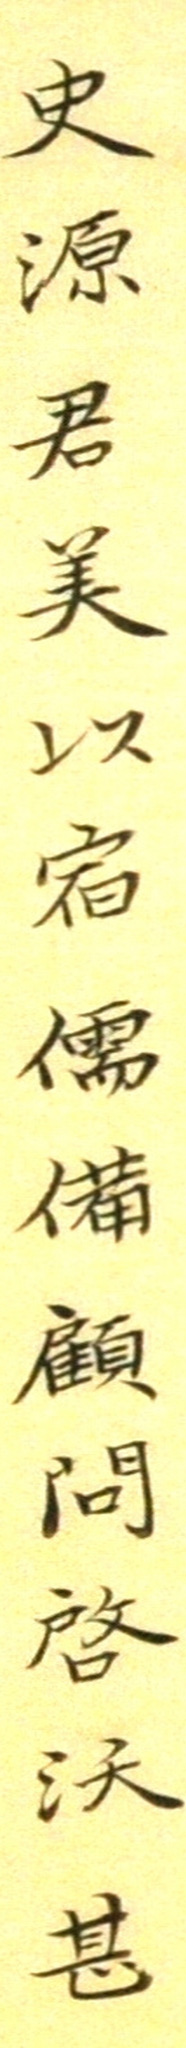史源君美以宿儒備顧問啓沃甚
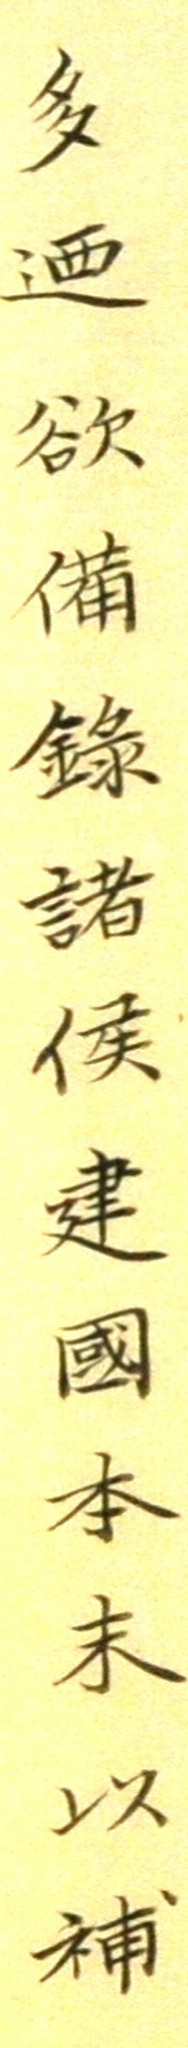多廼欲備録諸侯建国本末以補
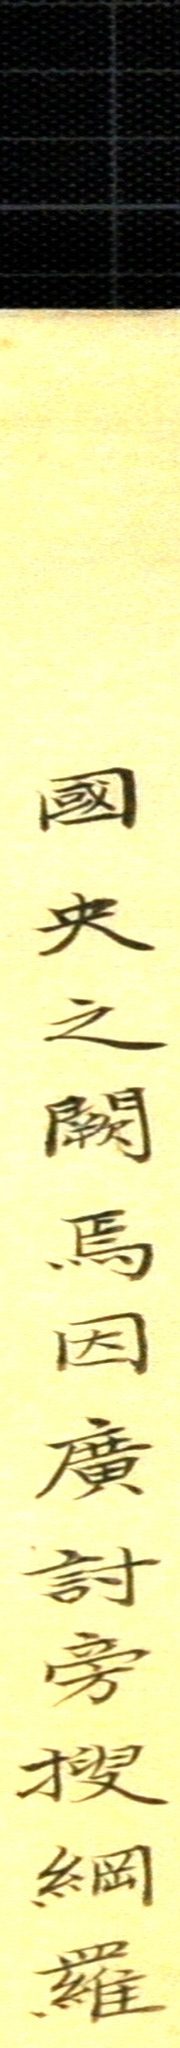国央之闕焉因広討旁捜綱羅
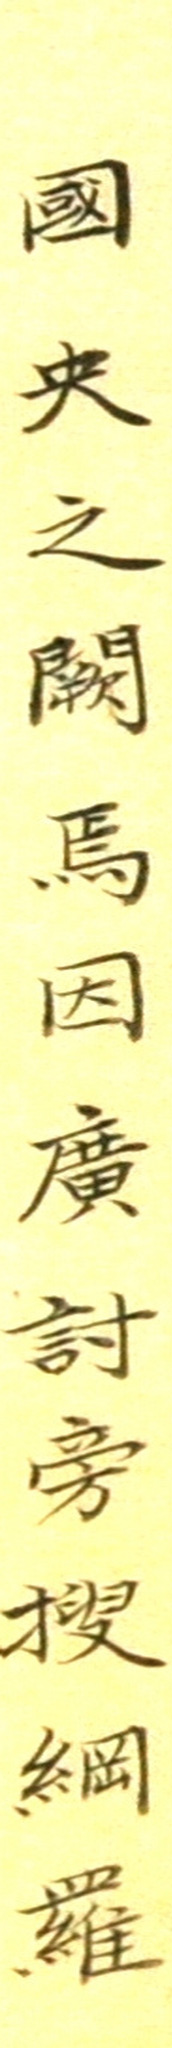国央之闕焉因広討旁捜綱羅

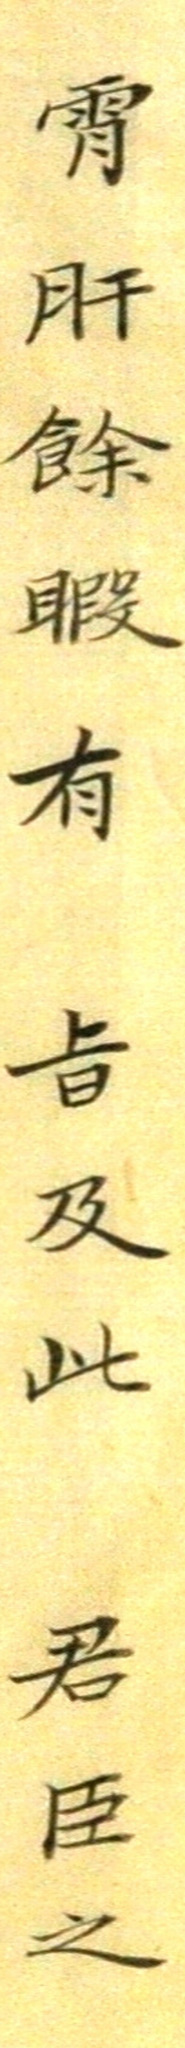宵旰余暇有旨及此君臣之
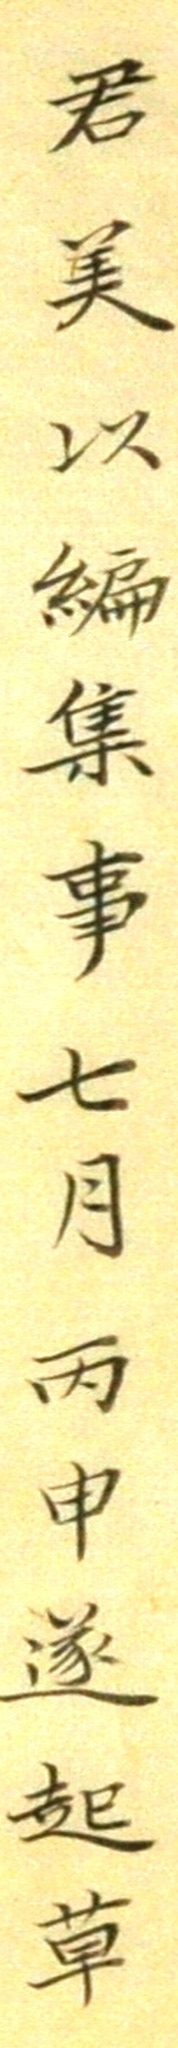君美以編集事七月丙申遂起草
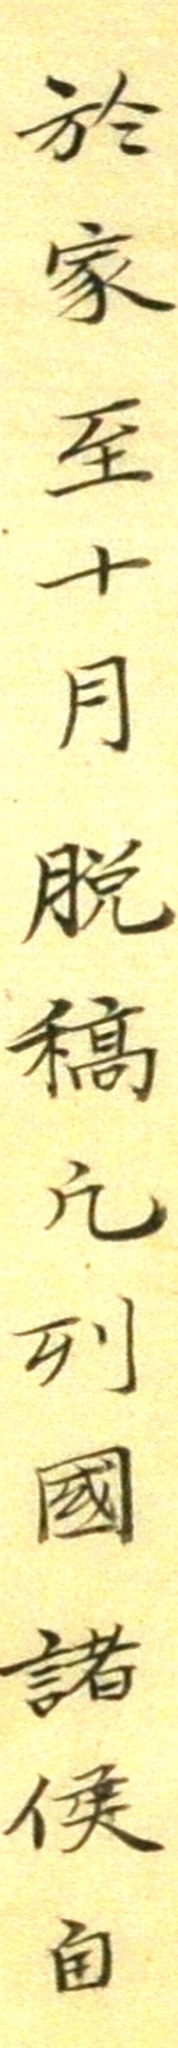於家至十月脱稿凡列国諸侯自
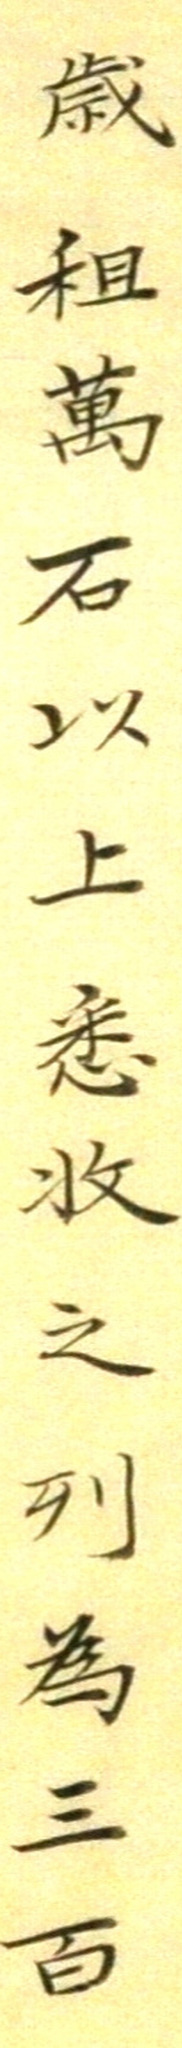歳租万石以上悉収之列為三百
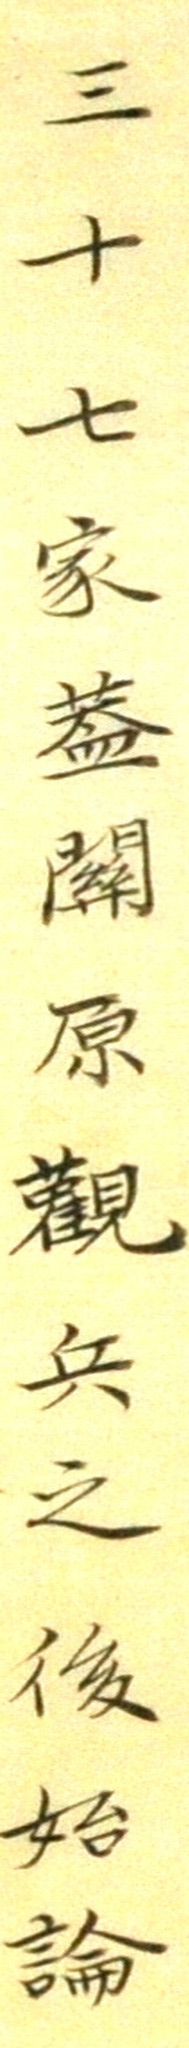三十七家葢関原観兵之後始論
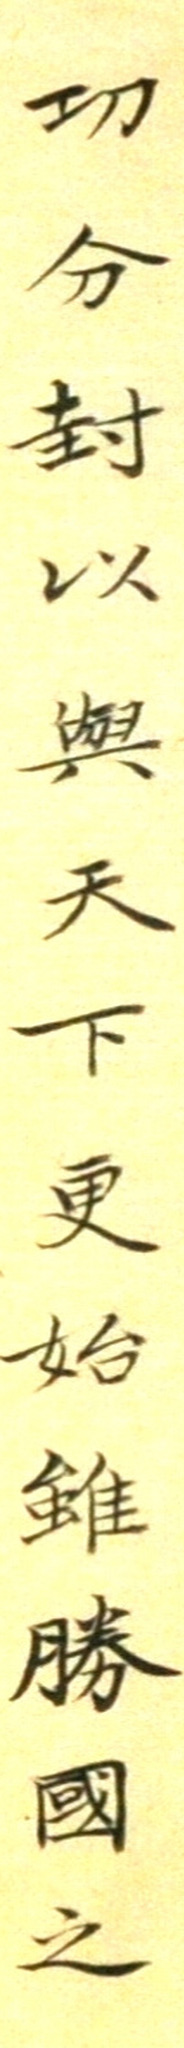功分封以与天下更始雖勝国之
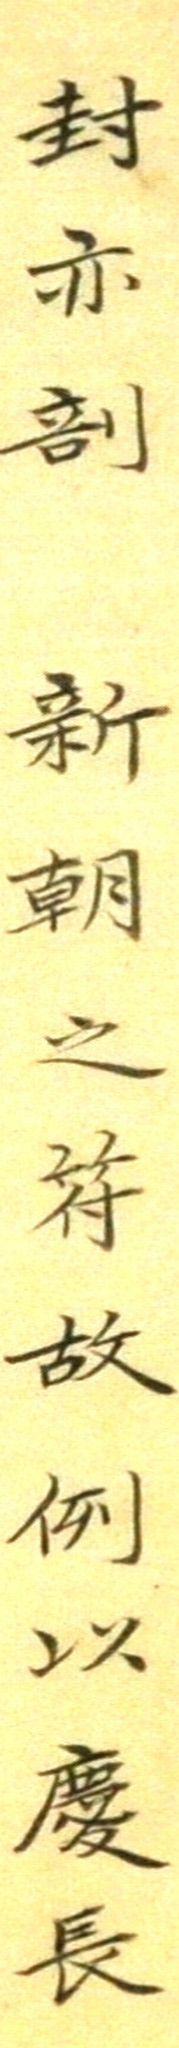封亦剖新朝之符故例以慶長
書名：藩翰譜（一）
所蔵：伊那市立高遠町図書館・合同会社AMANE
